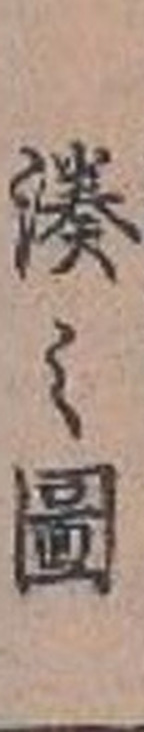湊の図

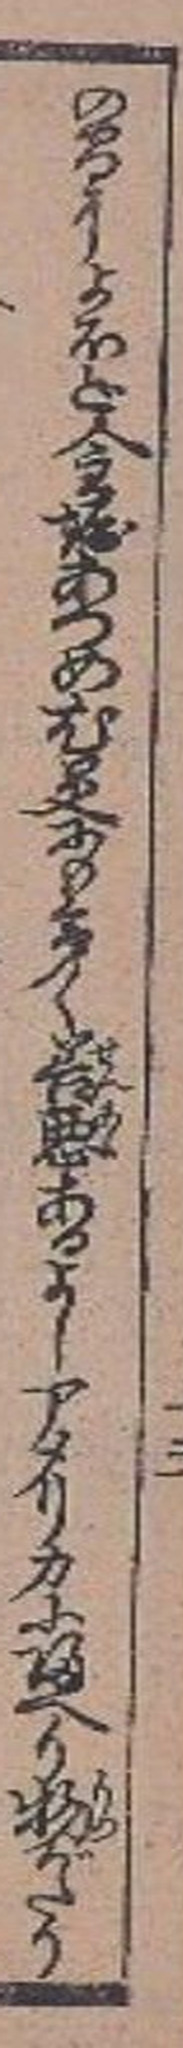の間によほど金掘？あつめむ是にも多く善悪あるよしアメリカに帰へり物がたり
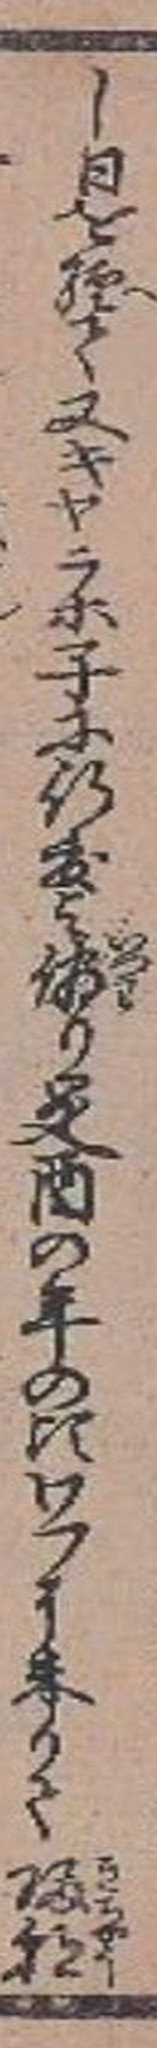し日を経て又キヤラホネに行度と偽り是酉の年の頃ワフに来りて帰朝
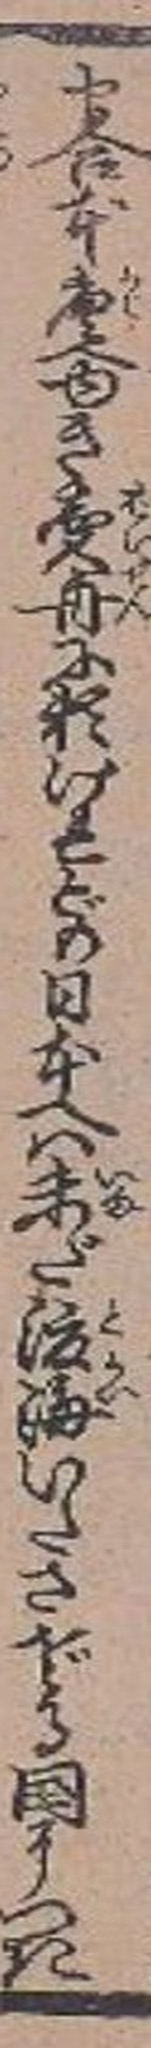申合本唐へゆき売舟に頼けれども日本へは未だ渡海いたさざる国につき
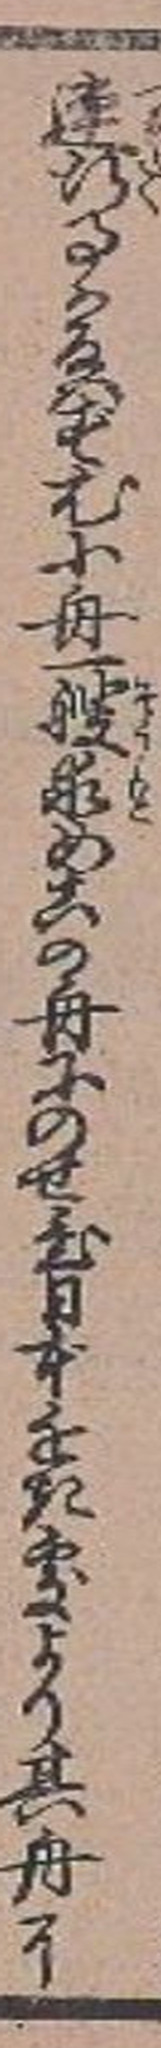連行事かなはずむ？小舟一艘求めこの舟にのせ置日本近き処より其舟に
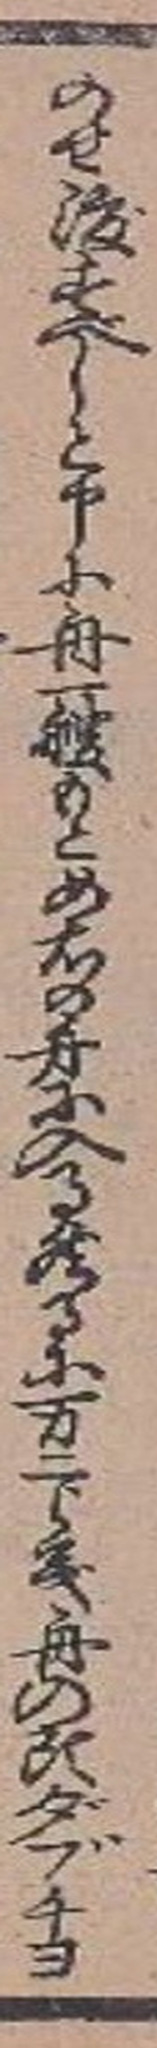のせ渡すべしと申に舟一艘もとめ右の舟に入る然るに万二郎其？舟の頭ダブチヨ
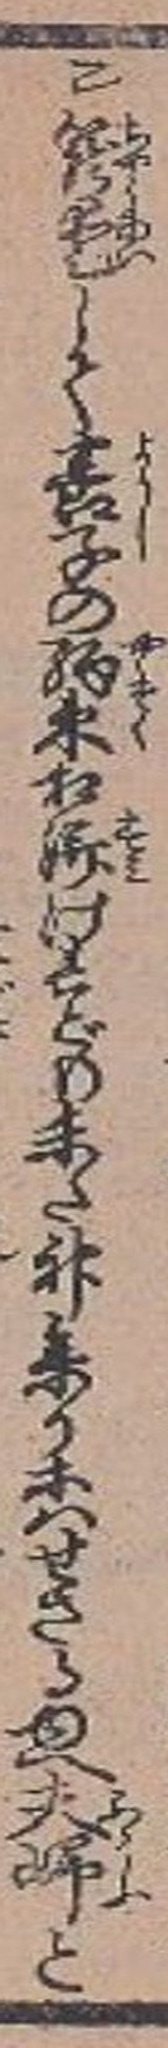と？寵愛して養子の約束相済けれども未た神参り等はせさるゆへ夫婦と
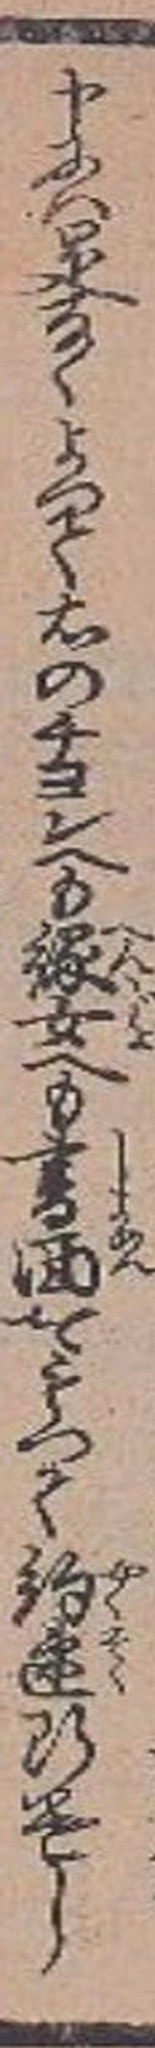申には是なくよつて右のチヨンへも縁女へも書面をもつて約束断遣？し
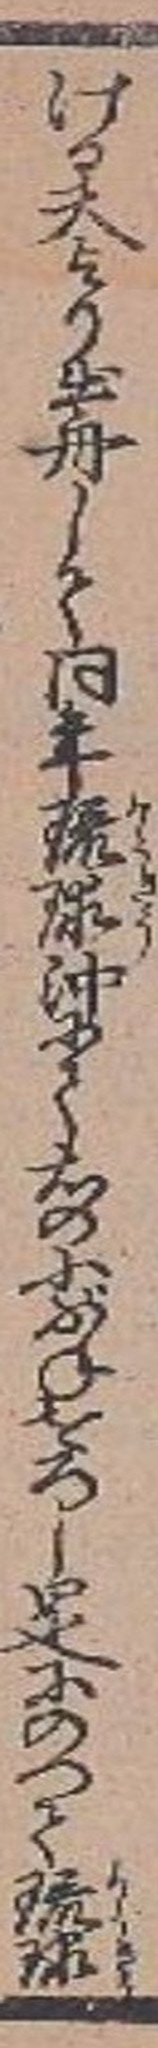ける夫より出舟して同年琉球沖にて右の小ぶねをろし是にのつて琉球
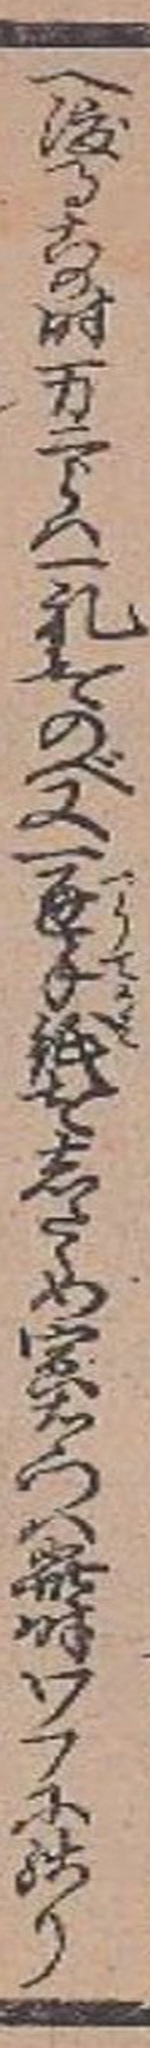へ渡るこの時万二郎は一礼をのべ又一通手紙をしたゝめ寅右衛門は此時ワフに残り
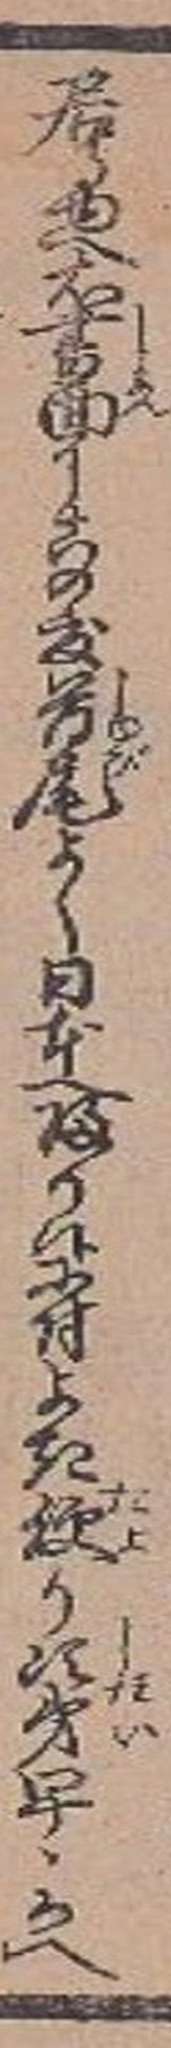居るゆへ右書面にこの度首尾よく日本へ帰り候に付よき便り次第早々かへ
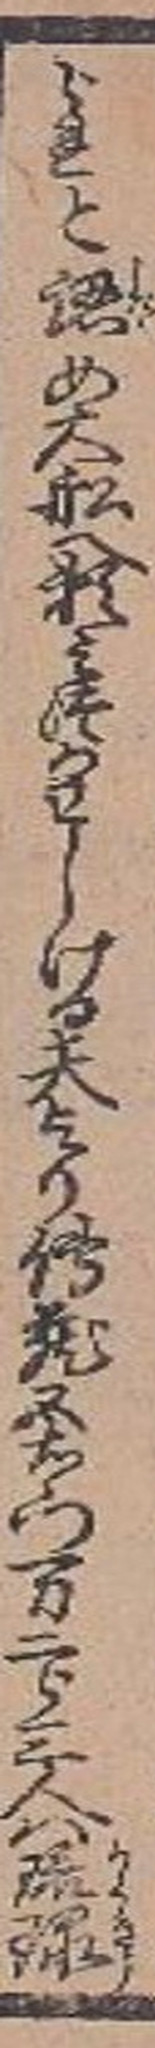られと認め大船へ頼みつかわしける夫より伝蔵五右衛門万二郎三人は琉球
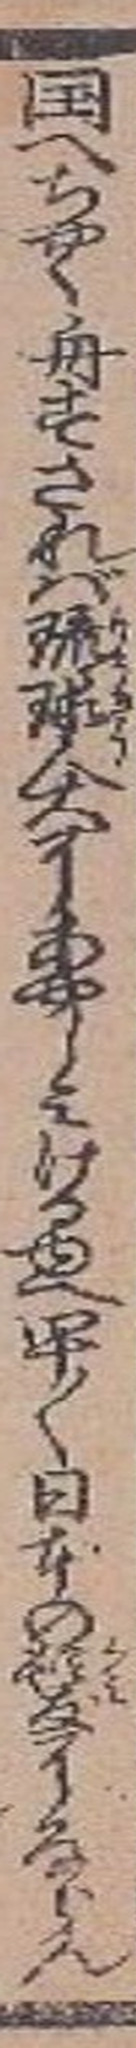国へちやく船すされば琉球人大にあやしみけるゆへ早〳〵日本の髪にならん
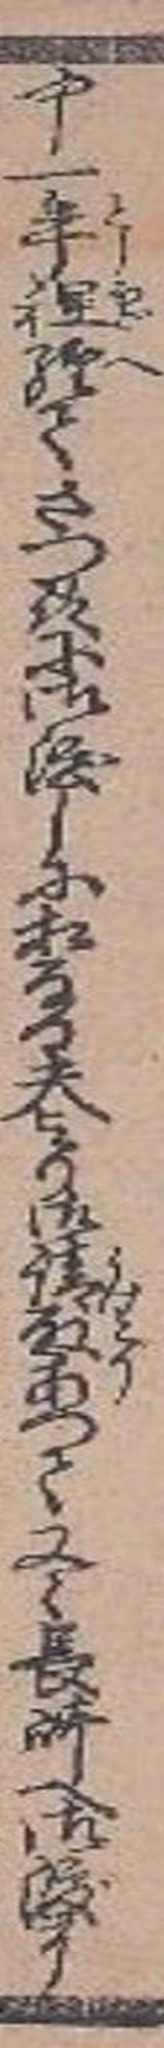や一年程経てさつ州に御渡しに相なる夫より御請取あつく又々？長崎へ御渡り
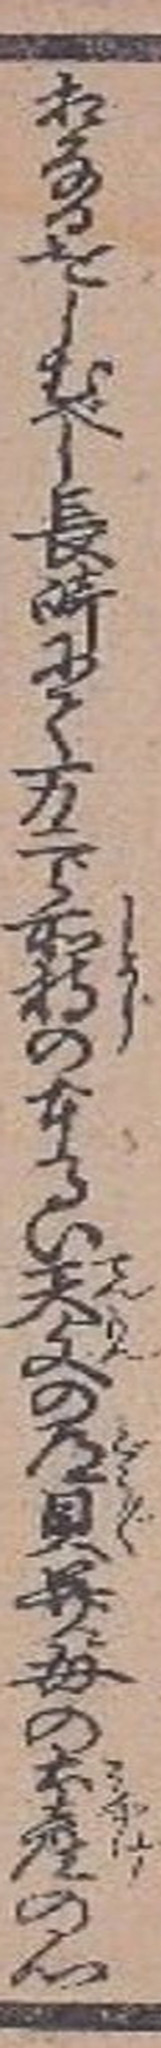相なるをしむべし長崎にて万二郎所持の本るい天文の土産の心
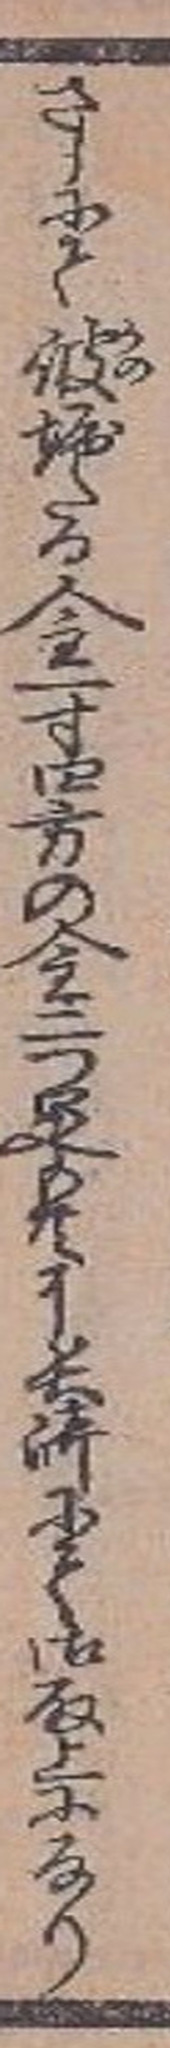さしにて彼掘たる金一寸四方の金二つ是も共に長崎にて御取上になり
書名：満次郎漂流記
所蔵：University of the Ryukyus Library
